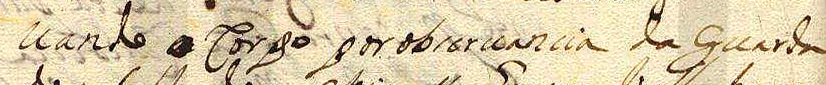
uando o Corpo por obseruancia da Guarda
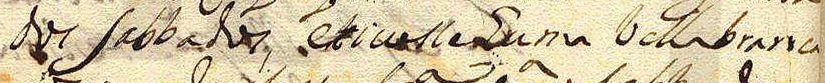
dos sabbados, e tiuesse huma vella branca
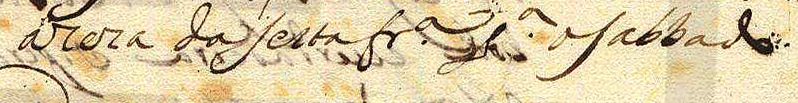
azeza da sesta fr.a p.a o sabbado:
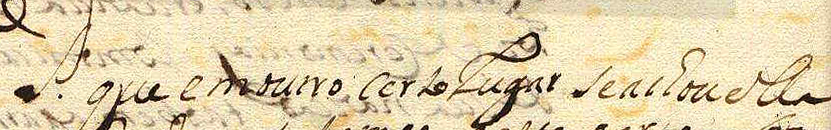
P. que em outro certo Lugar se achou ella
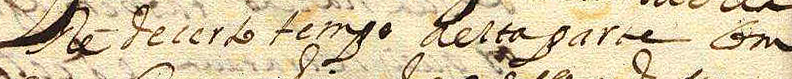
Ré de certo tempo desta parte com
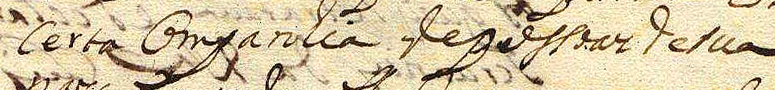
certa Companhia de pessoaz de sua
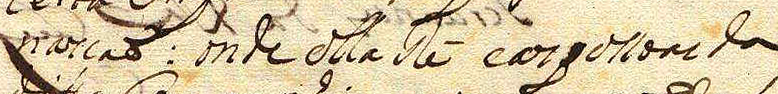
nazçaõ: onde ella Ré e as pessoas da
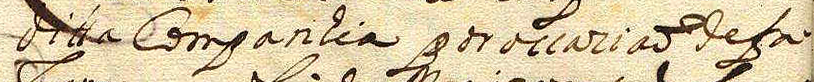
ditta Companhia por occaziaõ de fa
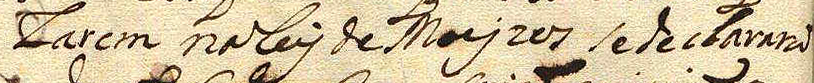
Larem na ley de Moyzes se declararaõ
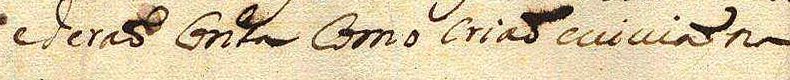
e deraõ Conta Como criaõ e uiuiaõ na
